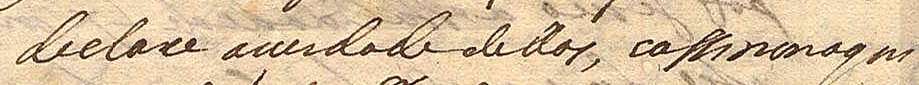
declare a uerdade dellas, e assinou aqui
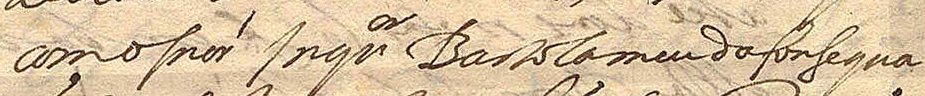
com o snor̄ Jnquor Bartolameu da fonsequa
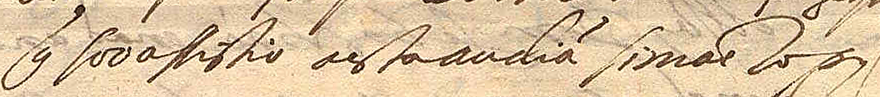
q̄ soo assistio a esta audiā simaõ lopz̄
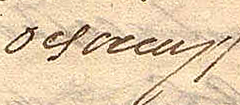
o escreuj /
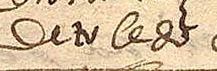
de toledo
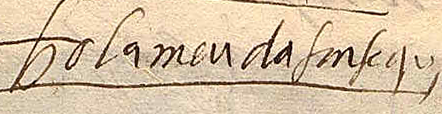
b̄olameu da fonseqa
